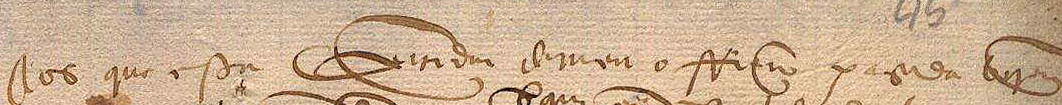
Aos que esta Certidaõ de meu officio pasada virem
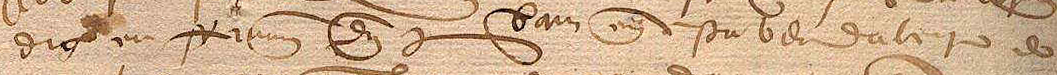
digo eu ffernam dīz tbam em esta vila daveiro do
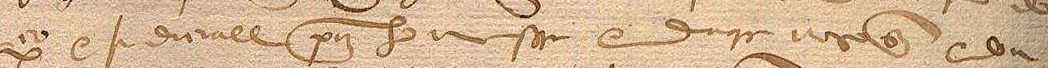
pco e Judiciall por ho meste e duqe noso s̄r e dou
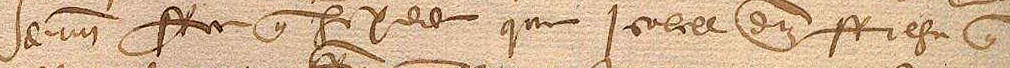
de mj̄ ffee q̄ he ꝟdade que Jsabell d̄iz ffilha q̄
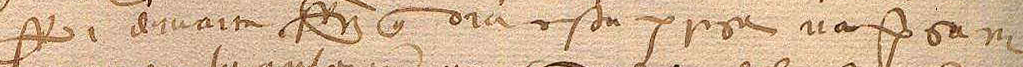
ffoi de marta ffr̄z q̄ ora esta presa na p̄sam
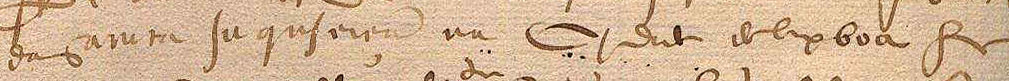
da samta Jnqujciçā na Cjdade de lixboa he
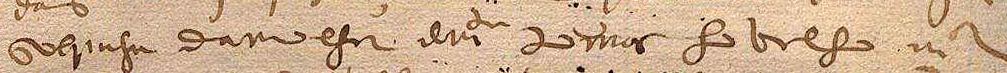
sobrinha da molher de mte tomas ho velho mor
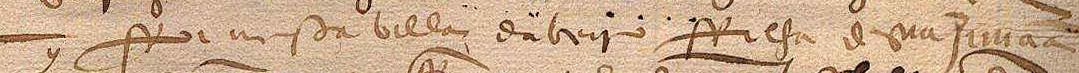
q̄ ffoi nesta villa daveiro ffilha de sua Jrmaā
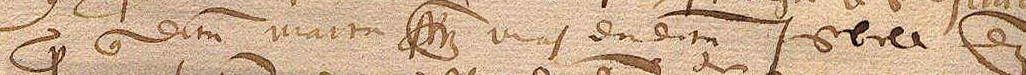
p̄oq̄ dita marta ffr̄z maj da dita Jsabell dīz
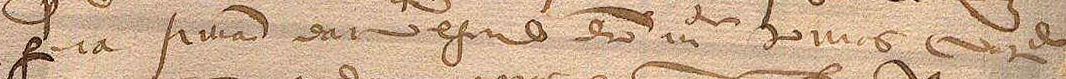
hera Jrmā da molher do dt̄o mte tomas contdo
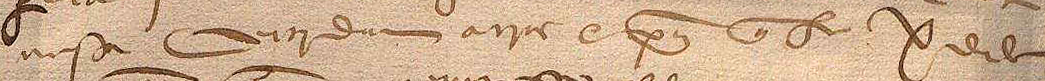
nesta Certjdam atras e porq̄ he ꝟdade
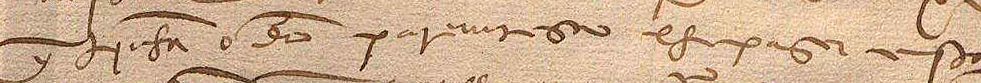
q̄ tynhā o dt̄o paremtesco lhe pasei esta
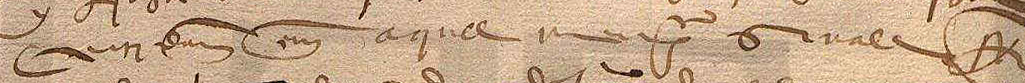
Certjdam em a quall meu pco sinall ffiz
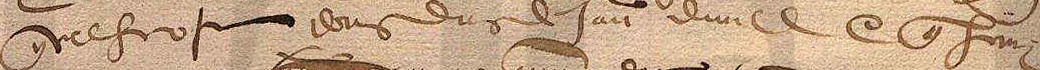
q̄ tal he oJe dous dias de Janro de mill e q̄hentos
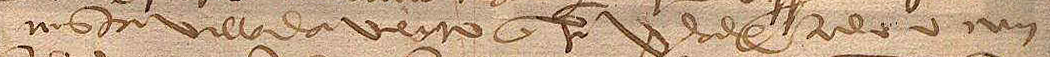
nesta villa daveiro q̄ he ꝟdade todo o com
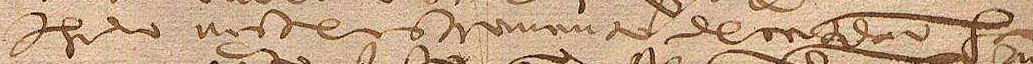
thedo neste estromento de certidão ha
